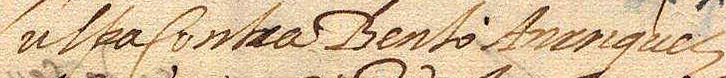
Culpa Contra Bento Anrriquez
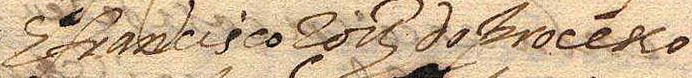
E francisco Roiz̄ do processo
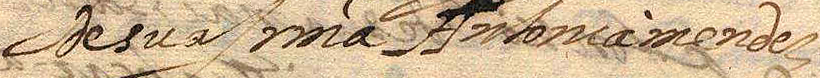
de sua Jrmã Antonia mendez
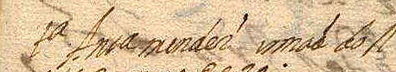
ta Anna mendez irmaã do R
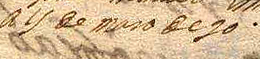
a 11 de Maio de 90
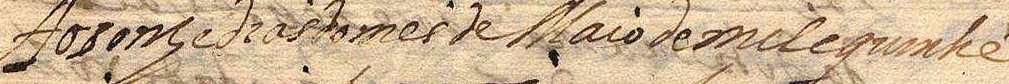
Aos onze dias do mes de Maio de mil e quinhē
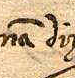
nā diz
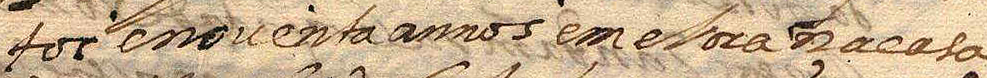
tos e nouenta annos em evora na casa
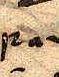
pa.
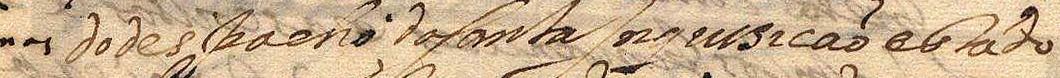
do despacho da Santa Jnquisiçaõ estādo
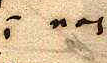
ē nas
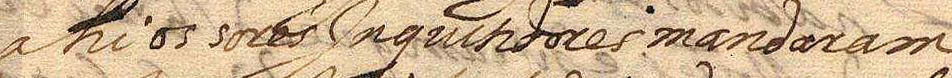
ahi os sorēs Jnquisidores mandaram
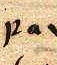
pa.
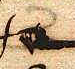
t_
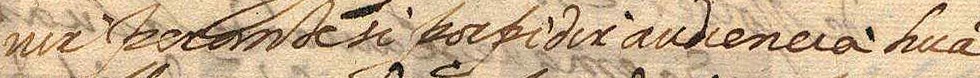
uir perante si por pidir audiencia huā
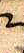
2
